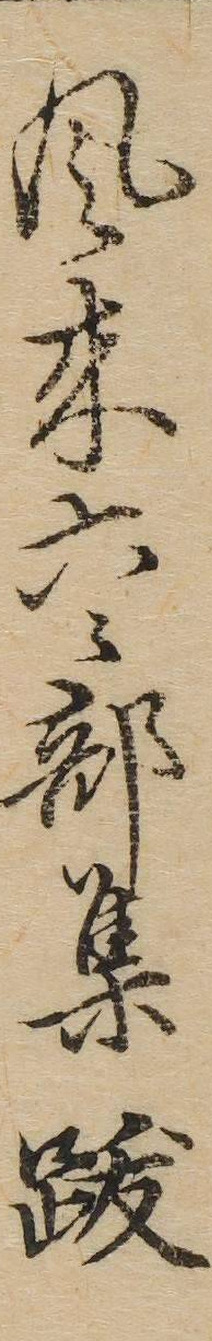風来六々部集跋
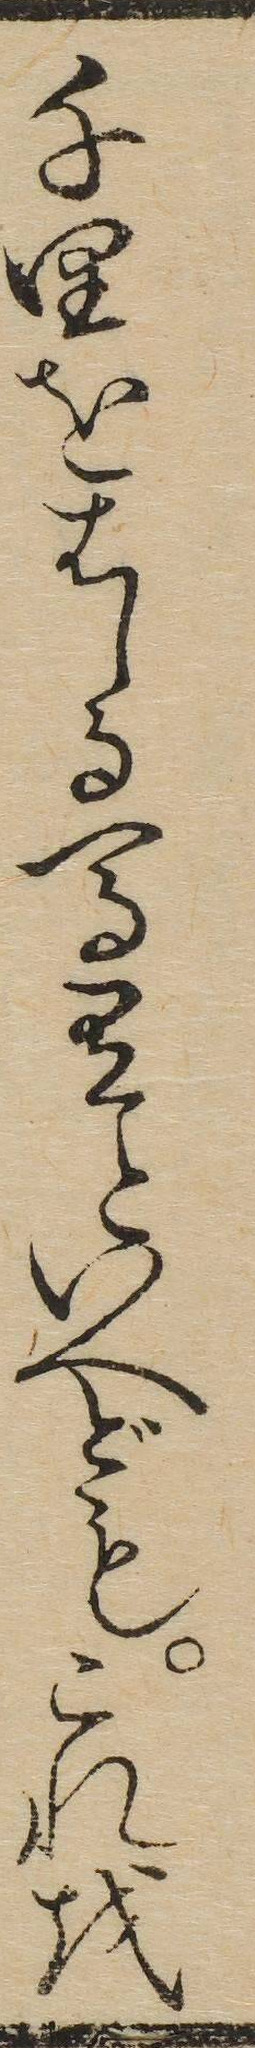千里をはしる馬有といへども。これを
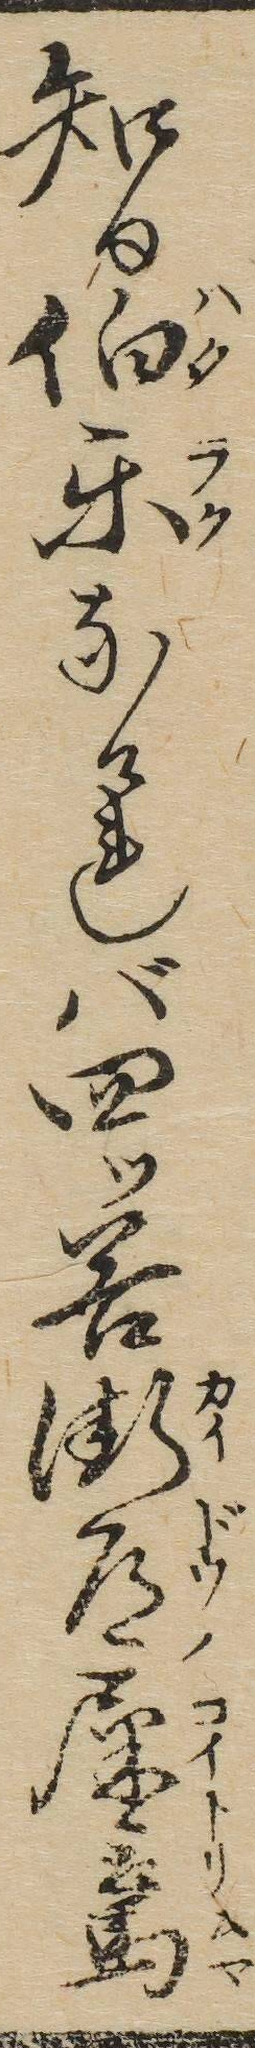知る伯楽なければ四ッ若街道屎取馬
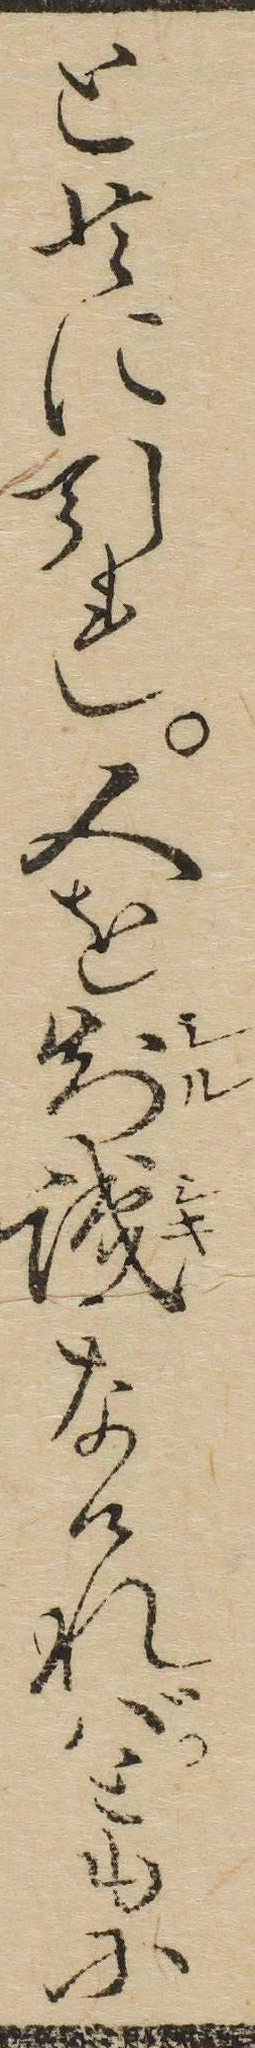と共に引れ。人を知識なければ。ともに
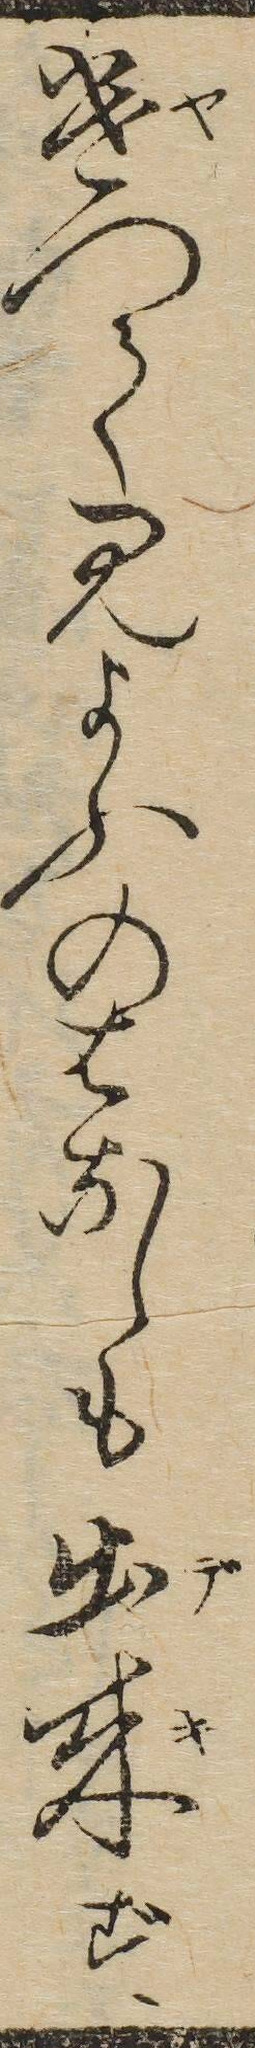遣つてみよふのはなしも出来ず
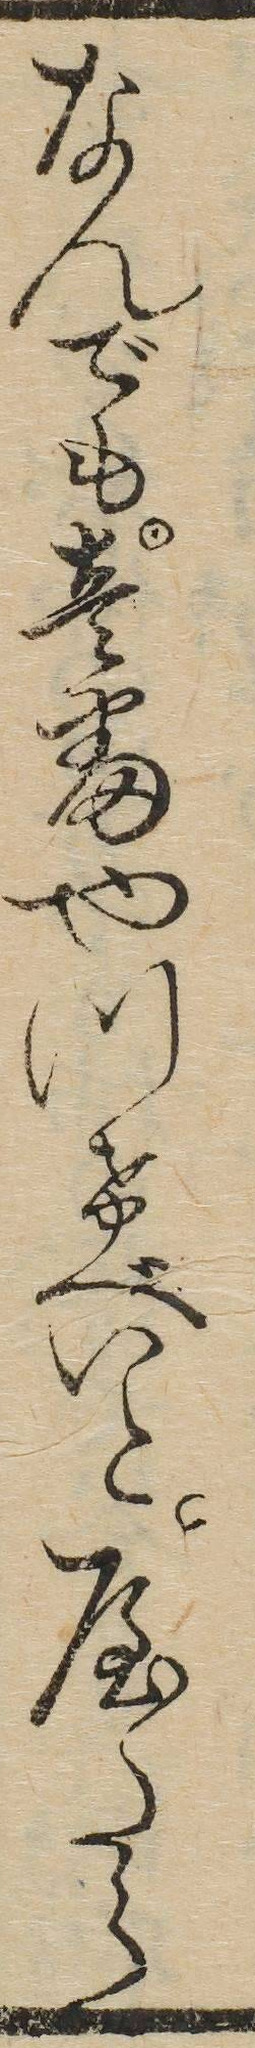なんでも。壱番やつけべいと。やたら
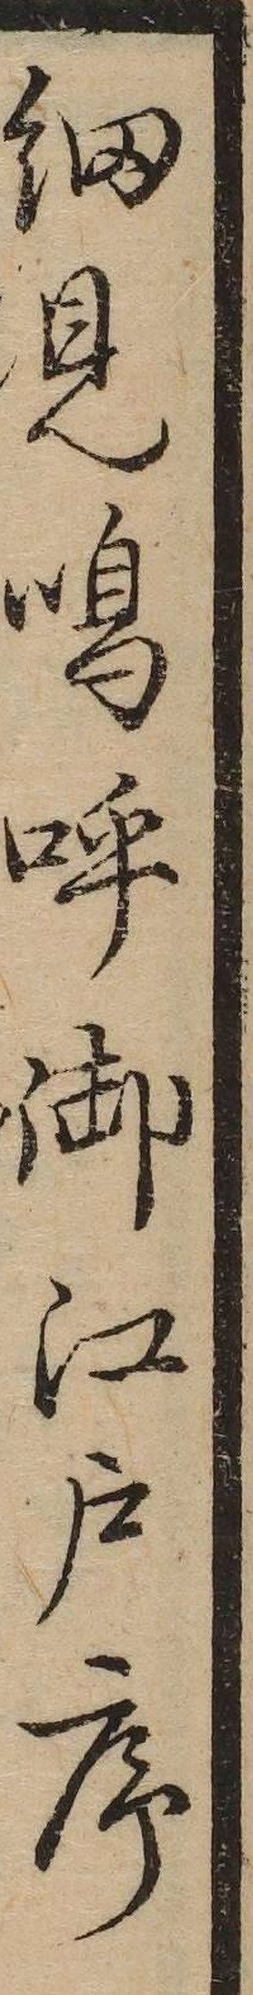細見嗚呼御江戸序
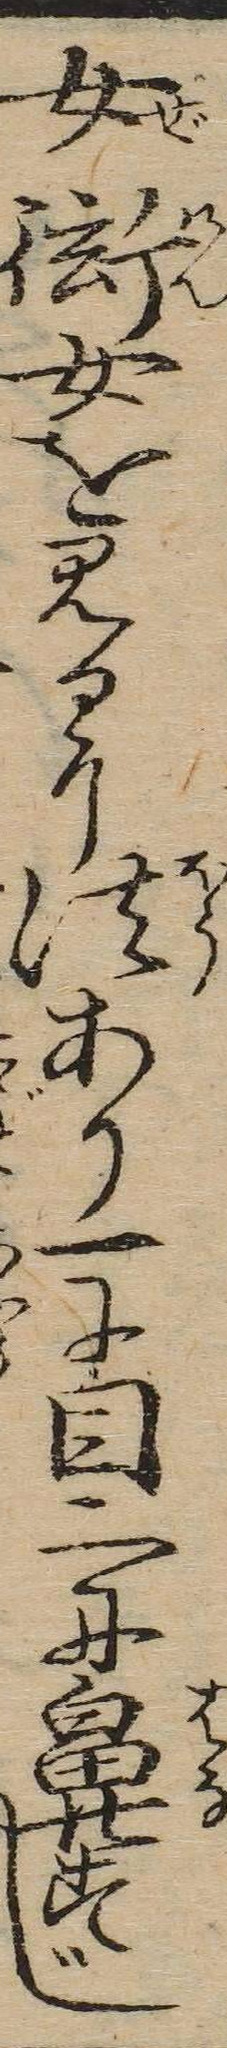女衒女を見るに法あり一に目二に鼻すじ
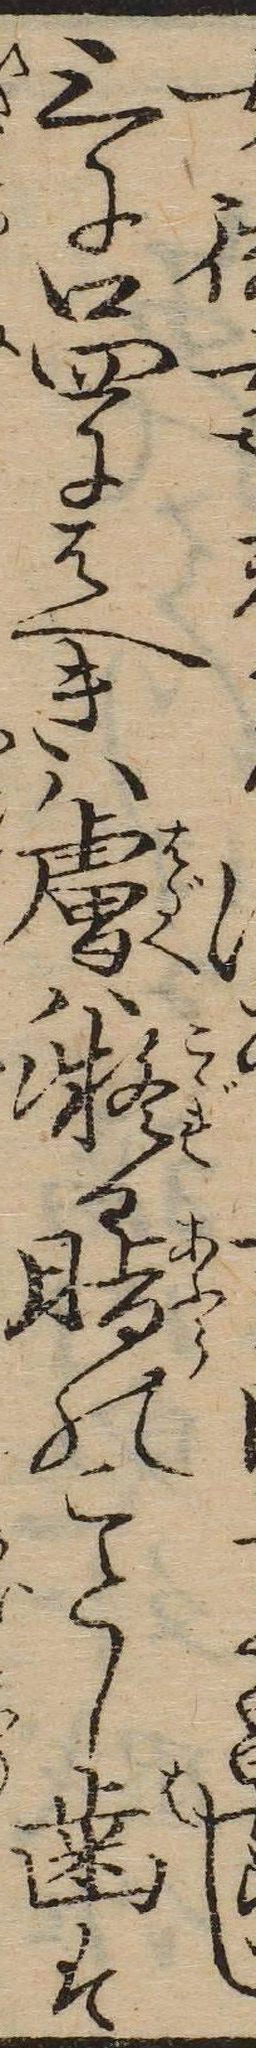三に口四にはへきは膚は凝る脂のことし歯は
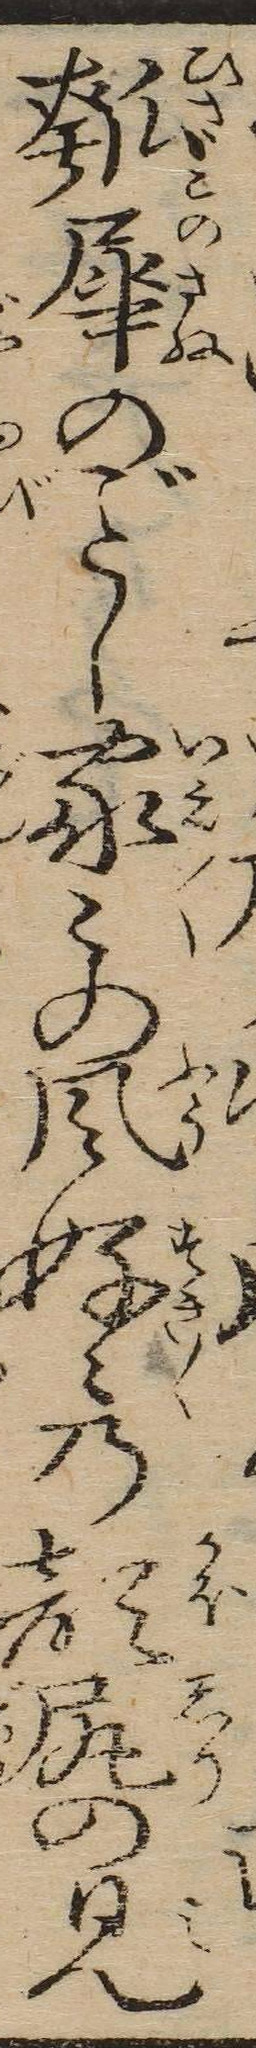瓠犀のごとし家々の風好々の顔尻の見
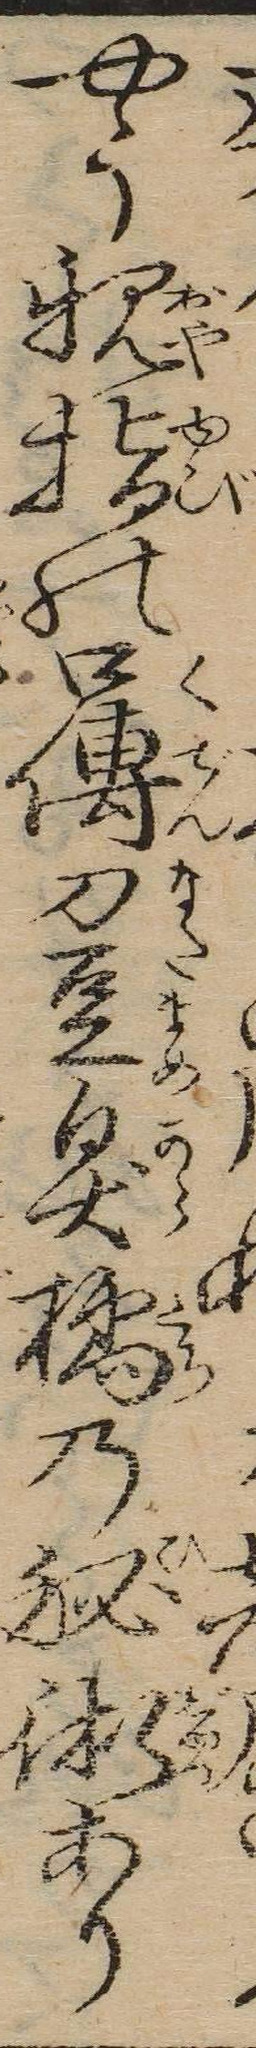やう親指の口伝刀豆臭橘の秘術あり
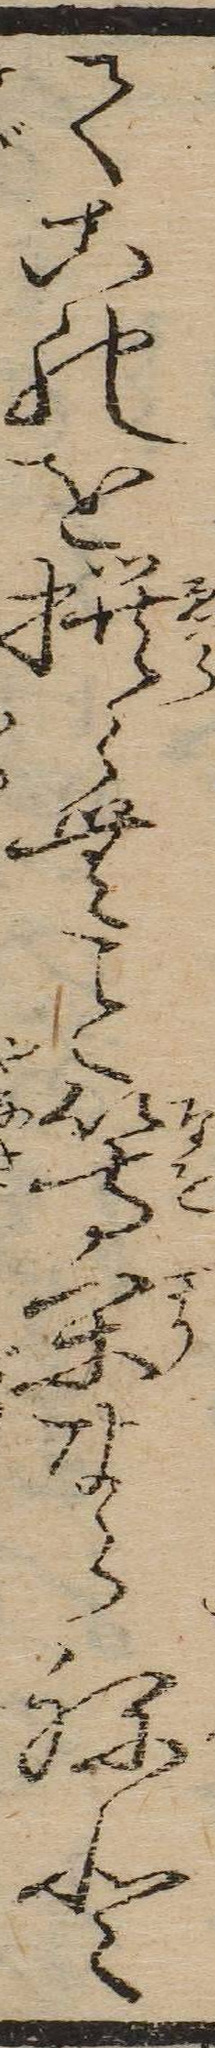てこれを撰らむこと等閑ならねと
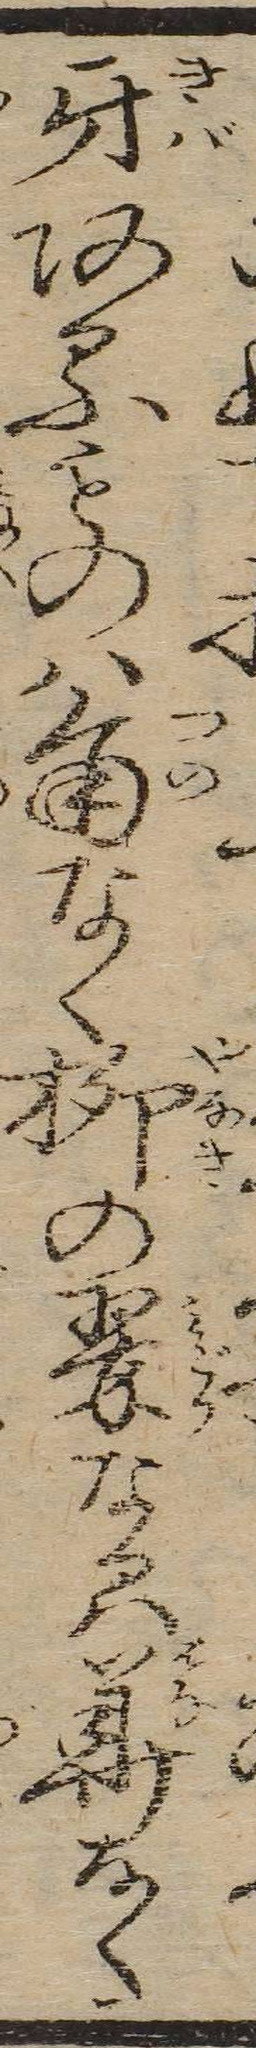牙あるものは角なく柳の翠なるは華なく
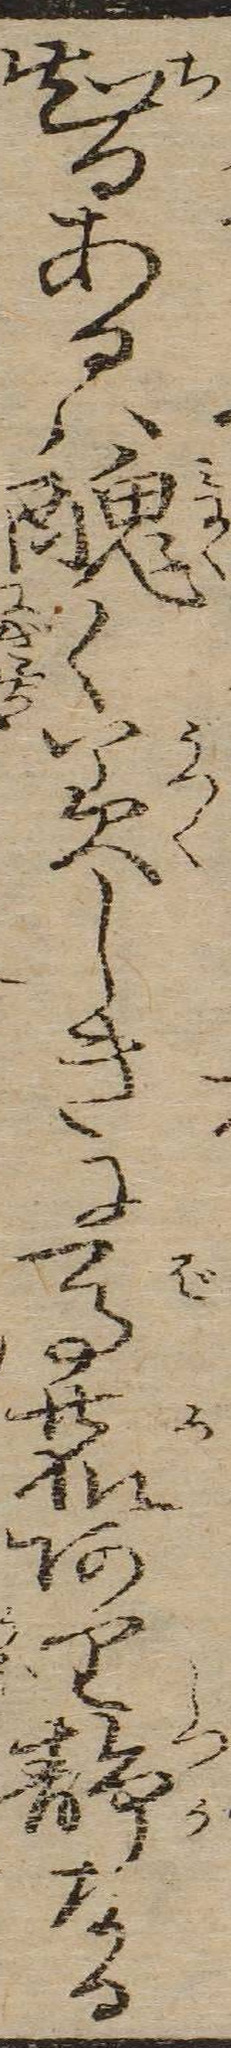知あるは醜く美しきに馬鹿あり静なる
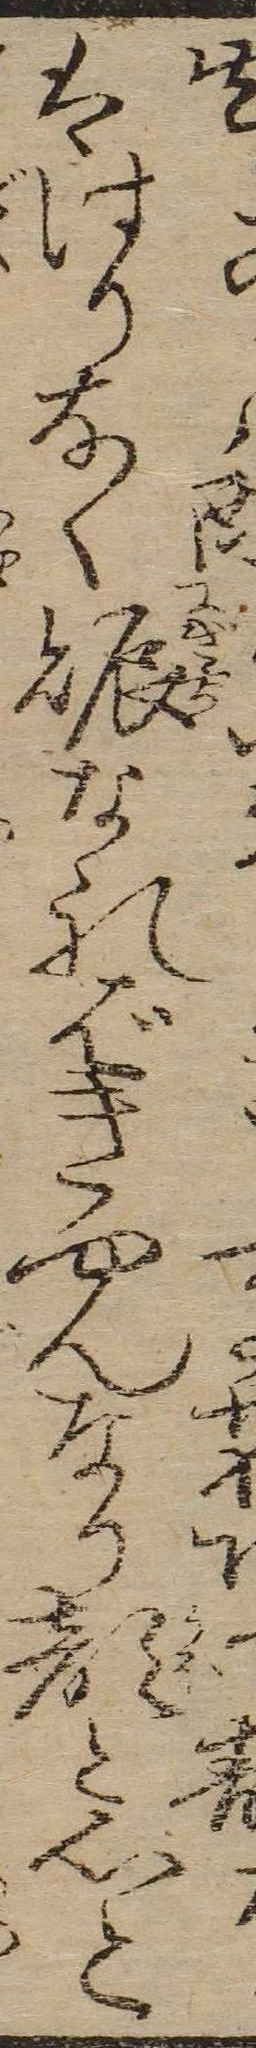ははりなく賑なればきやんなり顔と心と
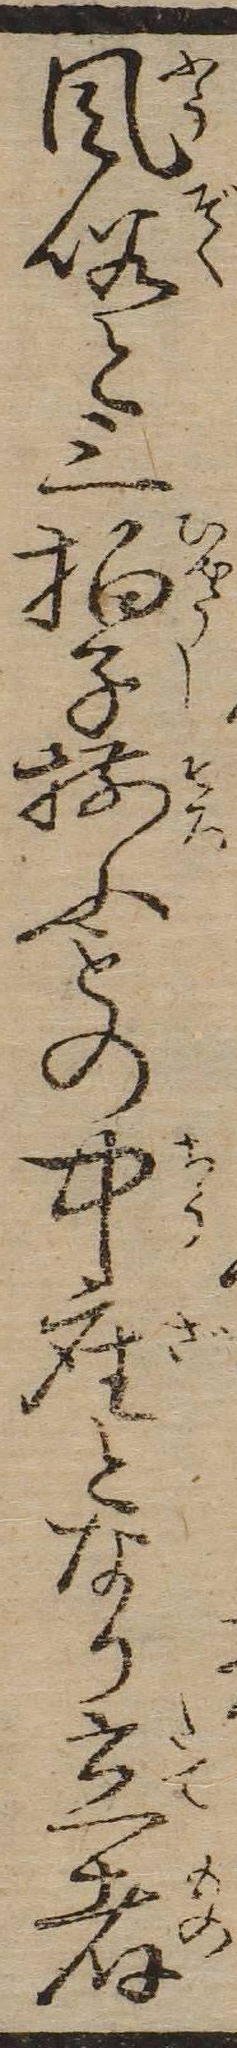風俗と三拍子揃ふもの中座となり
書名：細見嗚呼御江戸
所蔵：国文学研究資料館
